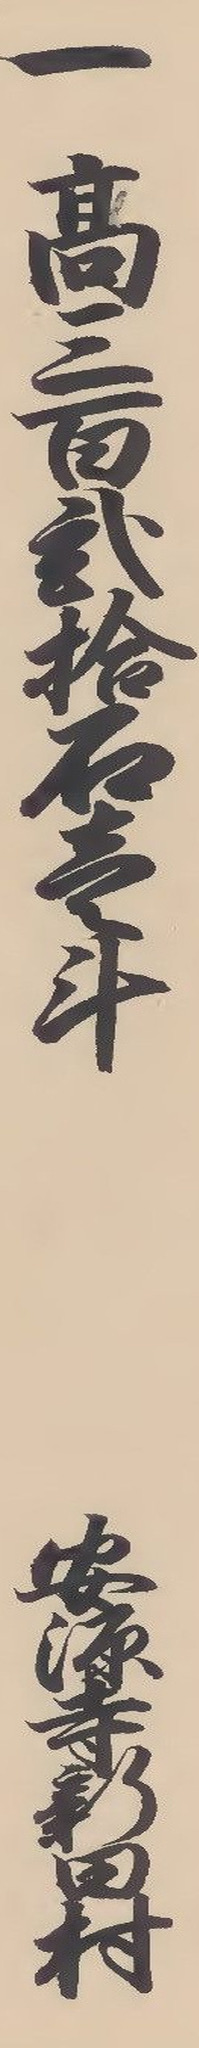一高三百弐拾石壱斗安源寺新田村
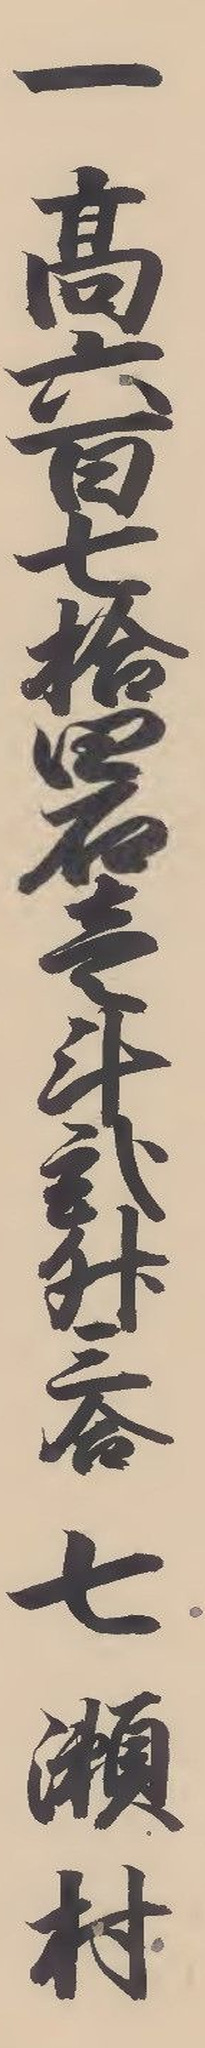一高六百七拾四石壱斗弐升三合七瀬村
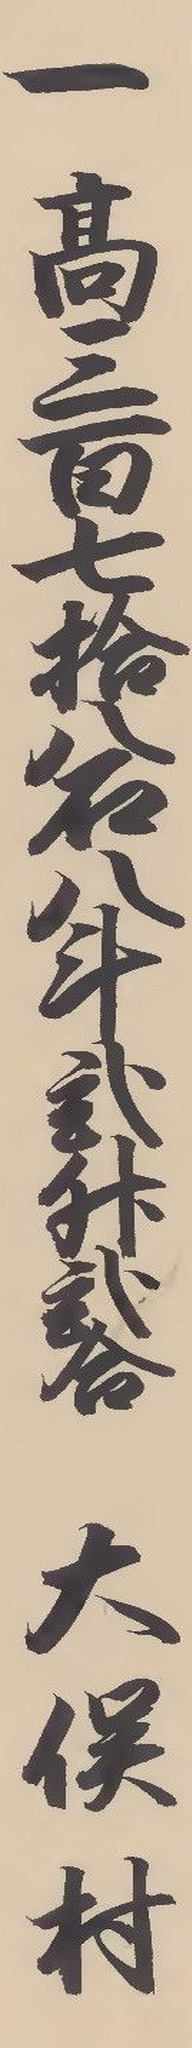一高三百七拾八石八斗弐升弐合大俣村
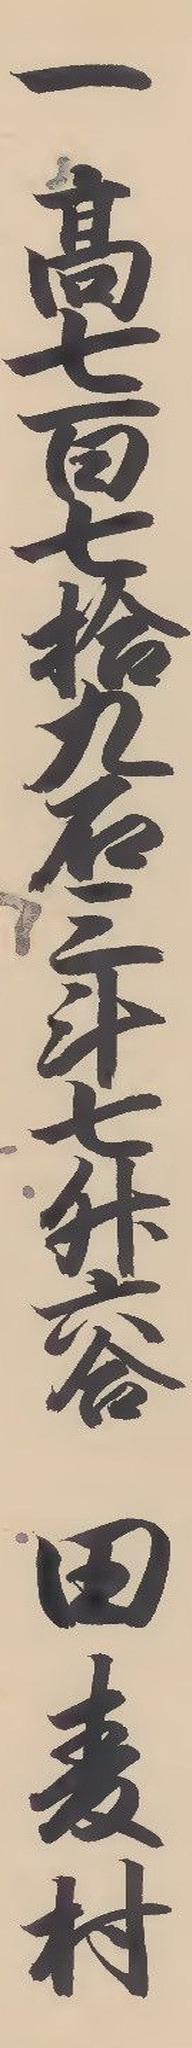一高七百七拾九石三斗七升六合田麦村

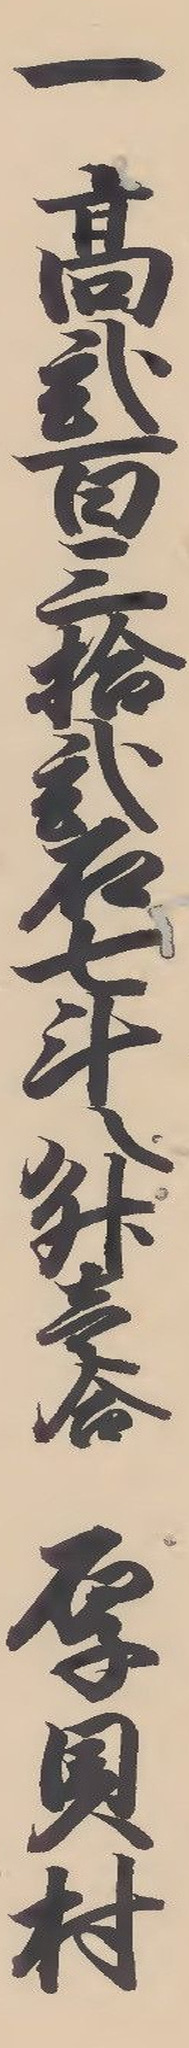一高弐百三拾弐石七斗八升壱合厚貝村
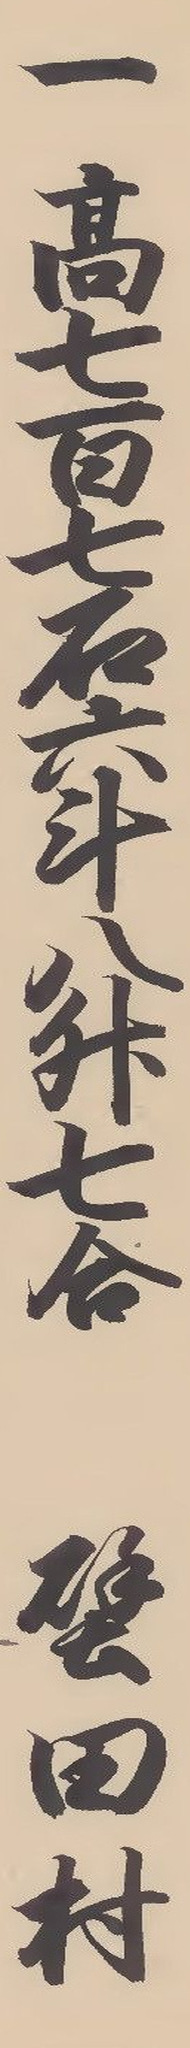一高七百七石六斗八升七合壁田村
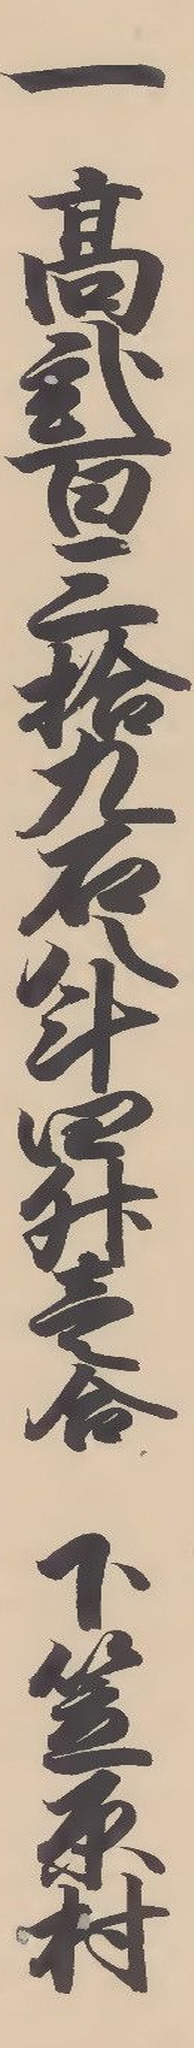一高弐百三拾九石八斗四升壱合下笠原村
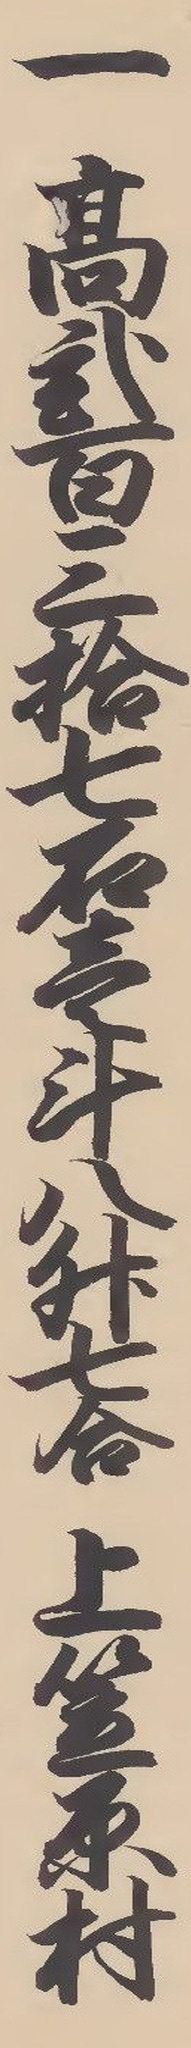一高弐百三拾七石壱斗八升七合上笠原村
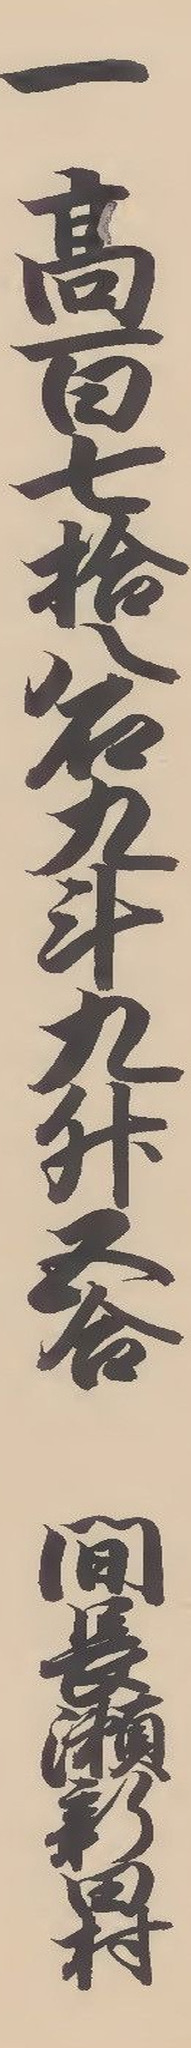一高百七拾八石九斗九升五合間長瀬新田村
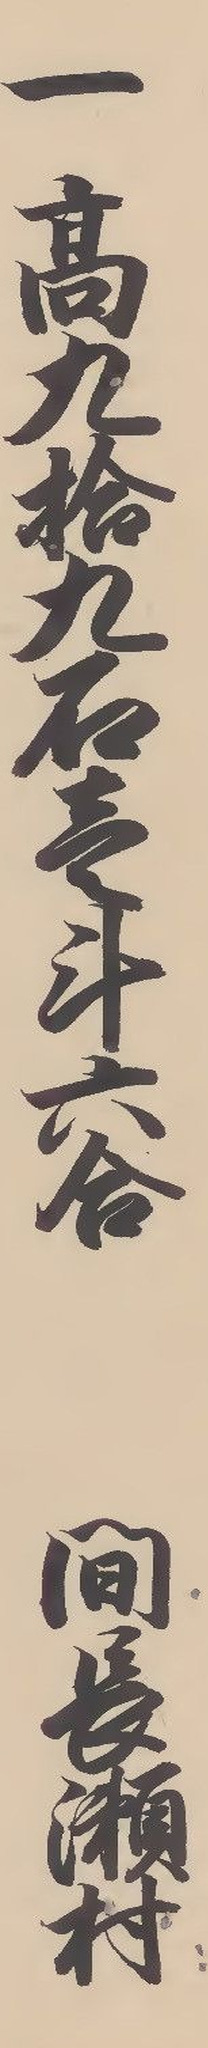一高九拾九石壱斗六合間長瀬村
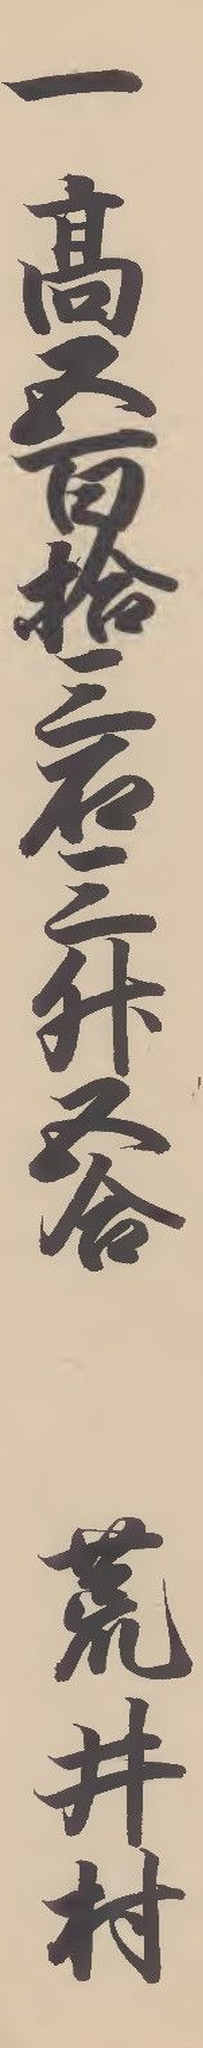一高五百拾三石三升五合荒井村
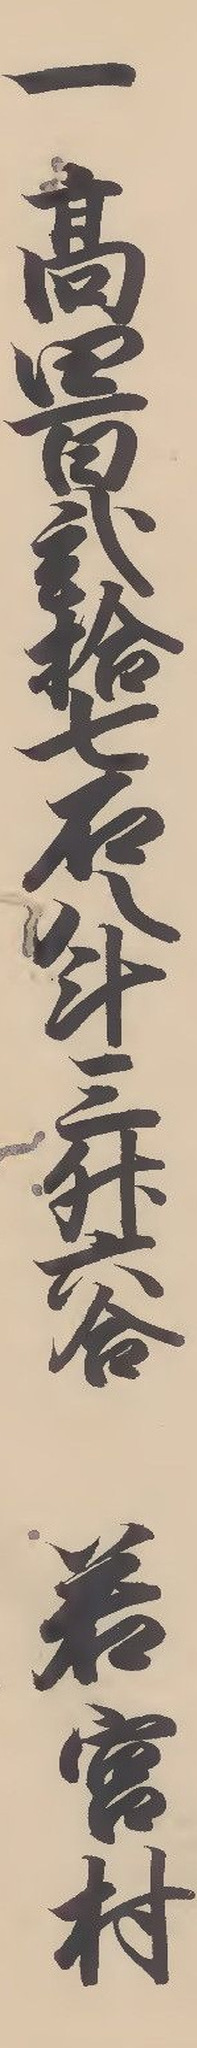一高四百弐拾七石八斗三升六合若宮村

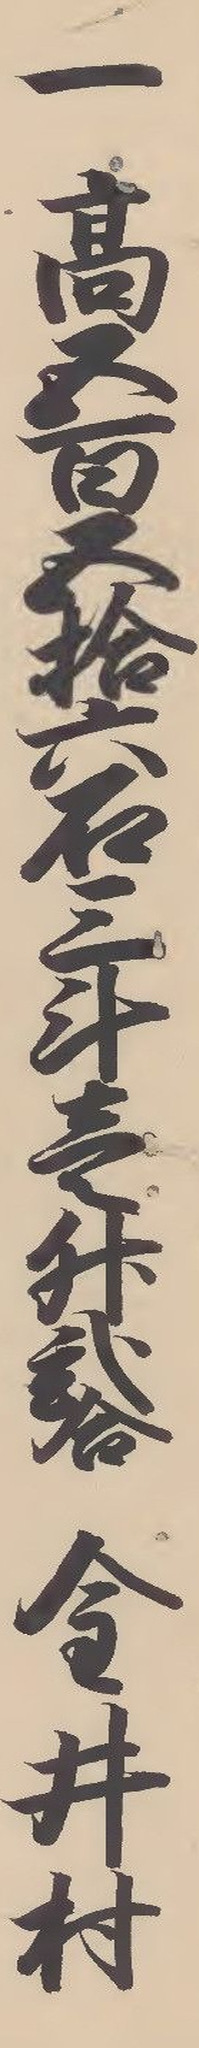一高五百五拾六石三斗壱升弐合金井村
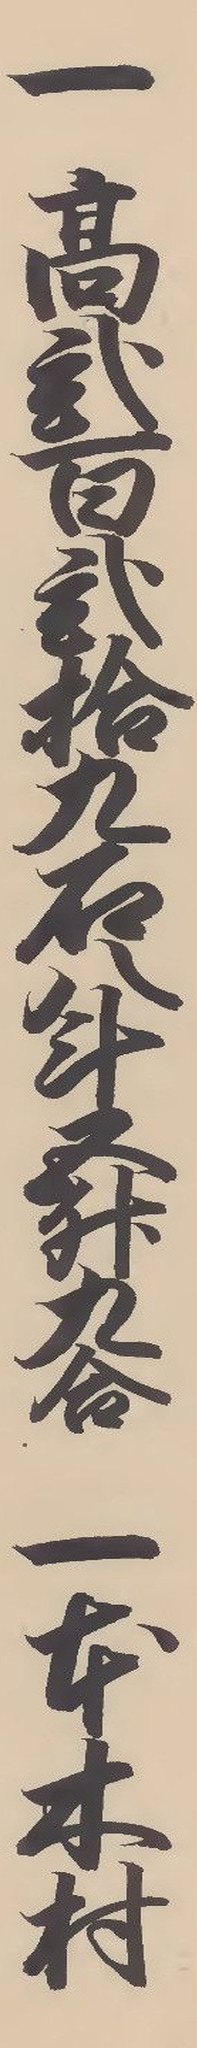一高弐百弐拾九石八斗五升九合一本木村
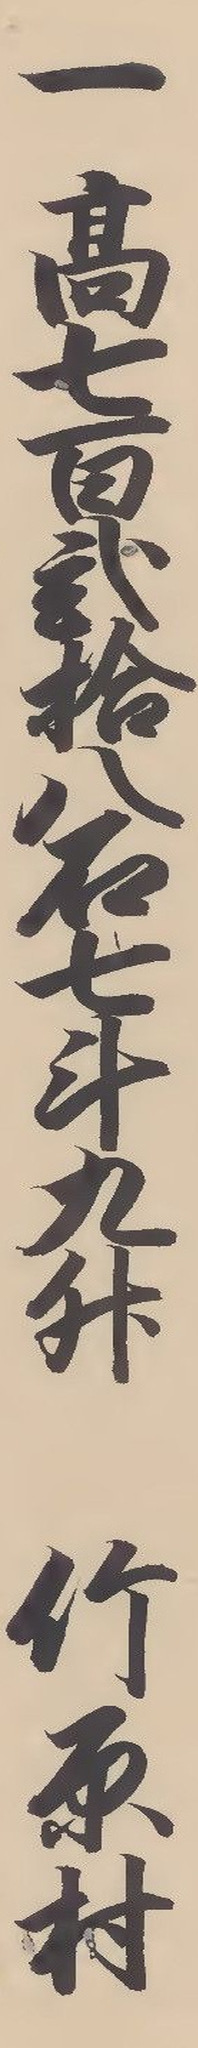一高七百弐拾八石七斗九升竹原村
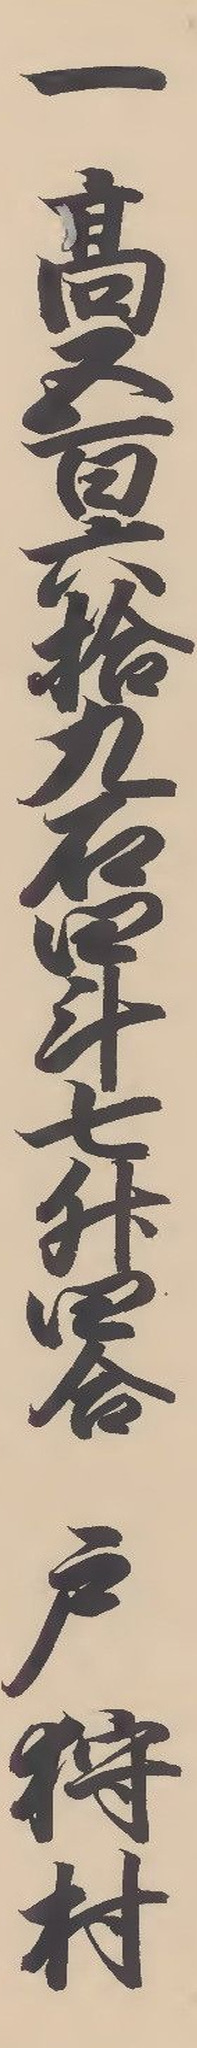一高五百六拾九石四斗七升四合戸狩村
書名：信濃国郷帳
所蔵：国立公文書館 National Archives of Japan
